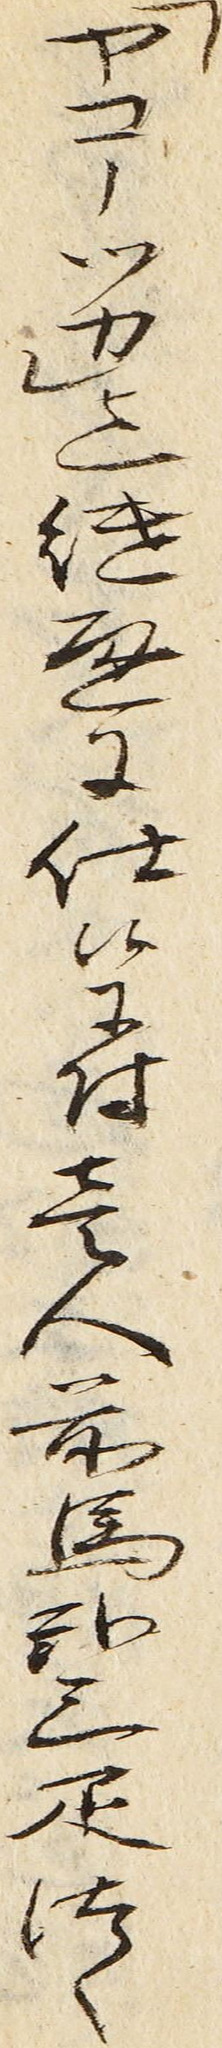「ヤコーツカ」迄継通に仕候に付壱人前馬弐三疋つゝ
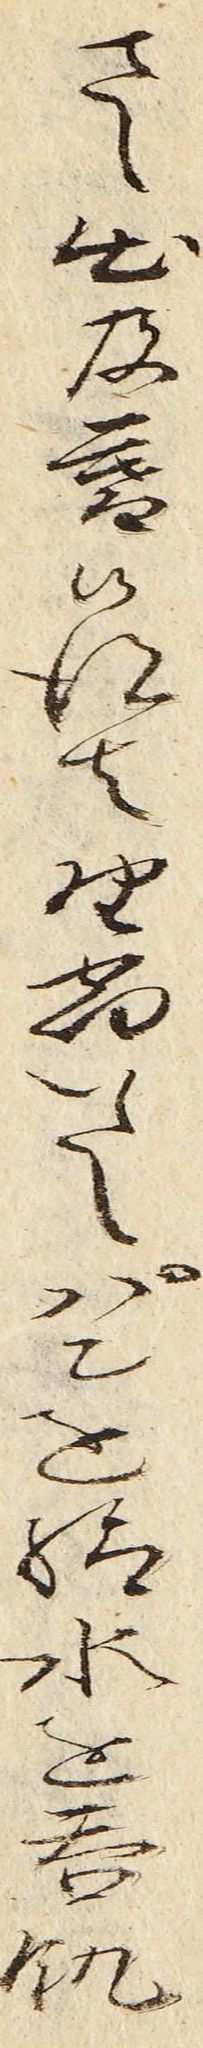さし出及暮候得は野宿いたしパンを給水を呑飢
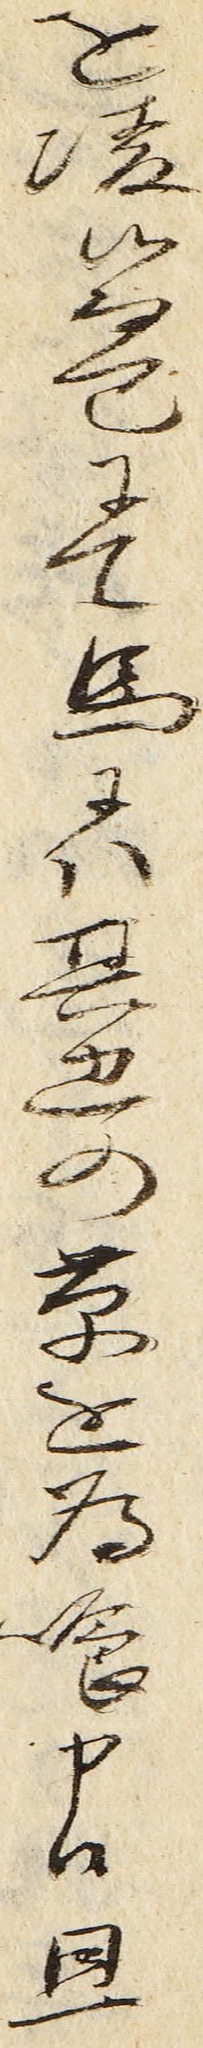を凌候而已にて馬には其辺の草を為喰申候且
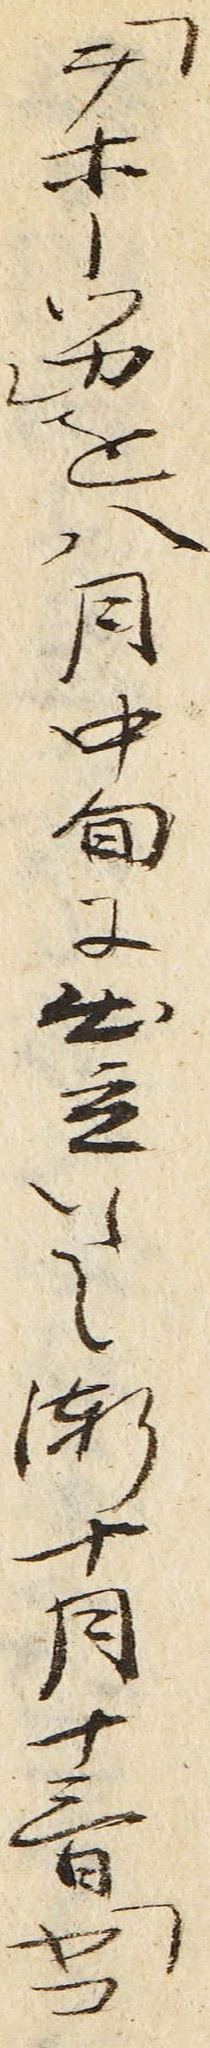「ヲホーツカ」を八月中旬に出立いたし漸十月十三日「ヤコ
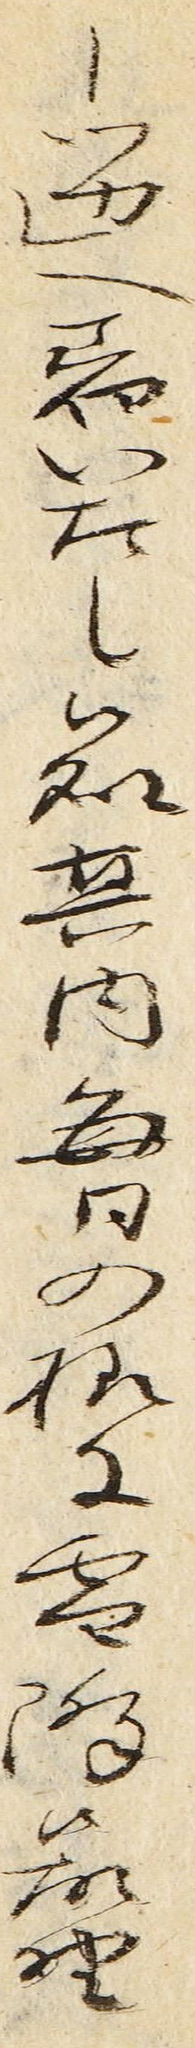ーツカ」へ着いたし候処其内毎日の様に雪降候故野
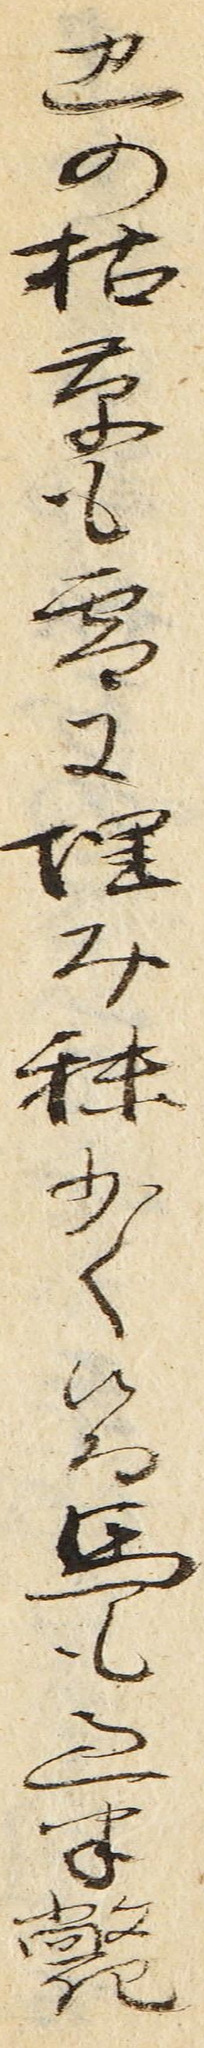辺の枯草も雪に埋み秣少く候て馬も過半斃

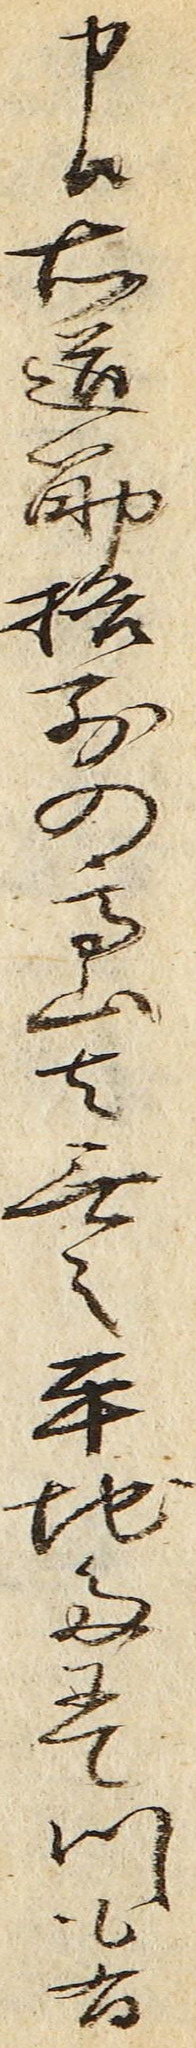申候右道筋格別の高山は無之平地多にて川も有
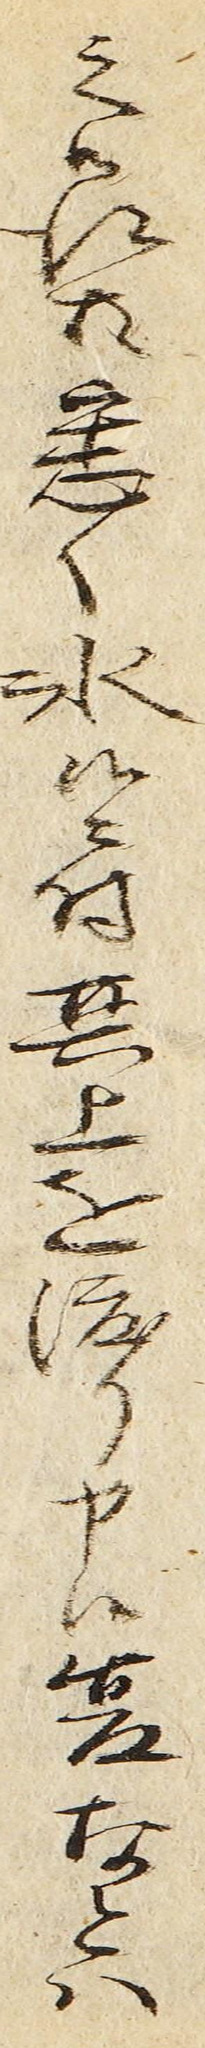之候得共悉く氷候に付其上を渡り申候夏なとは
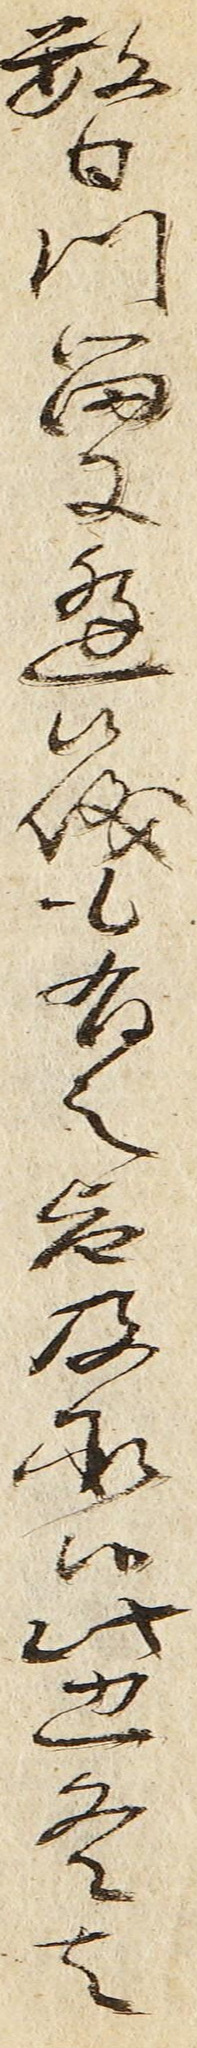数日川留に逢候儀も有之旨及承候此辺冬は
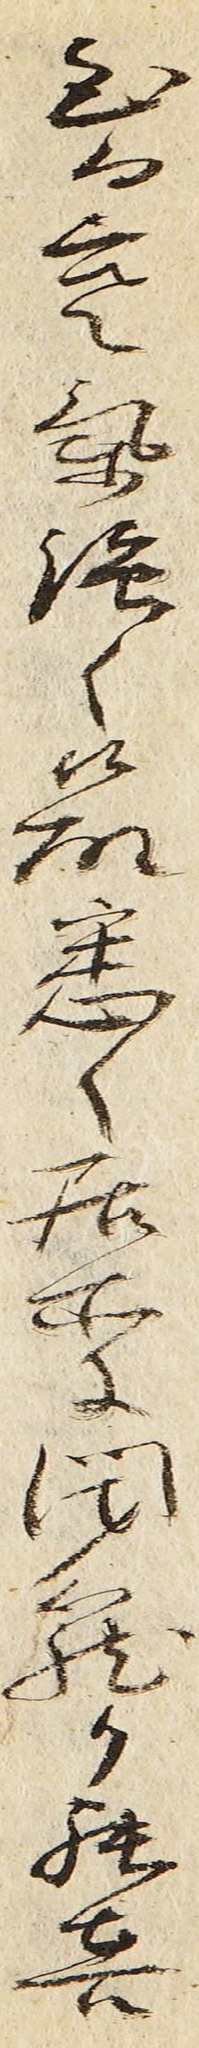至て寒気強く候故悉く居所に閉篭り罷在候
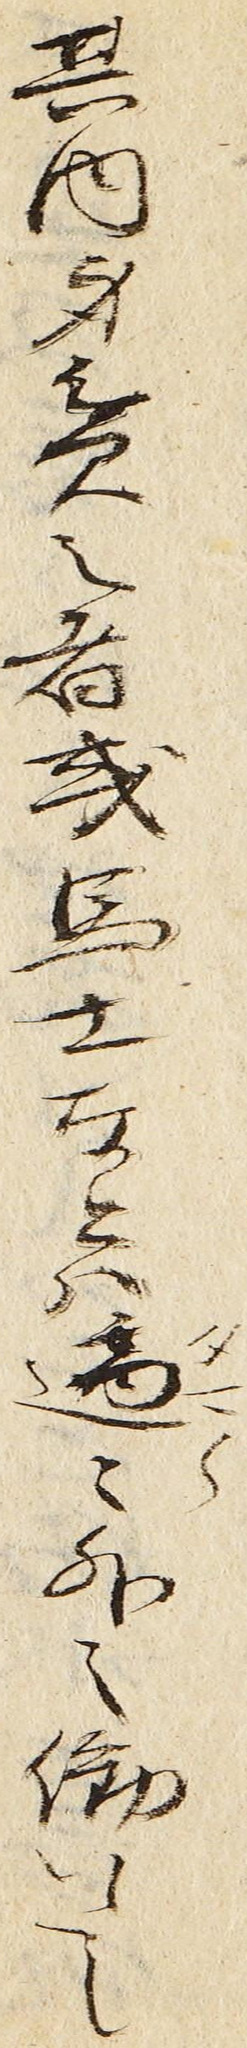其内身貧之者或馬士なとは適々外の働いたし
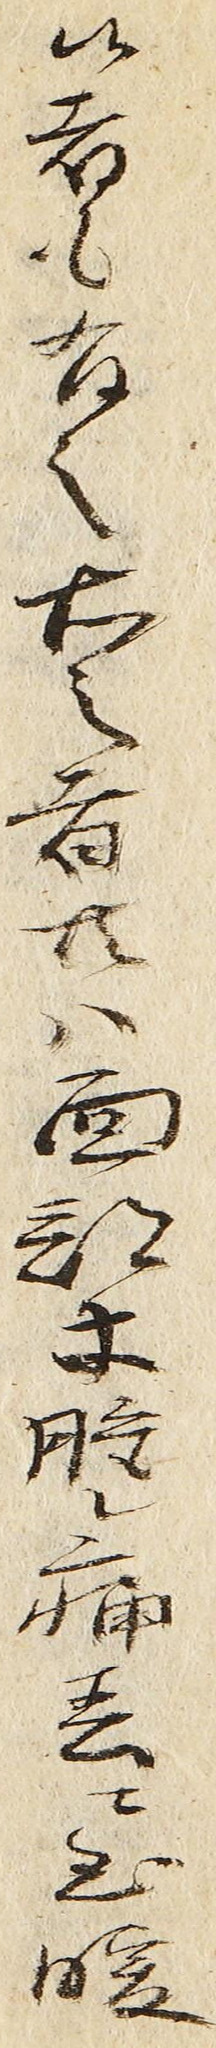候者も有之右之者共は面部等腫レ痛春に至暖
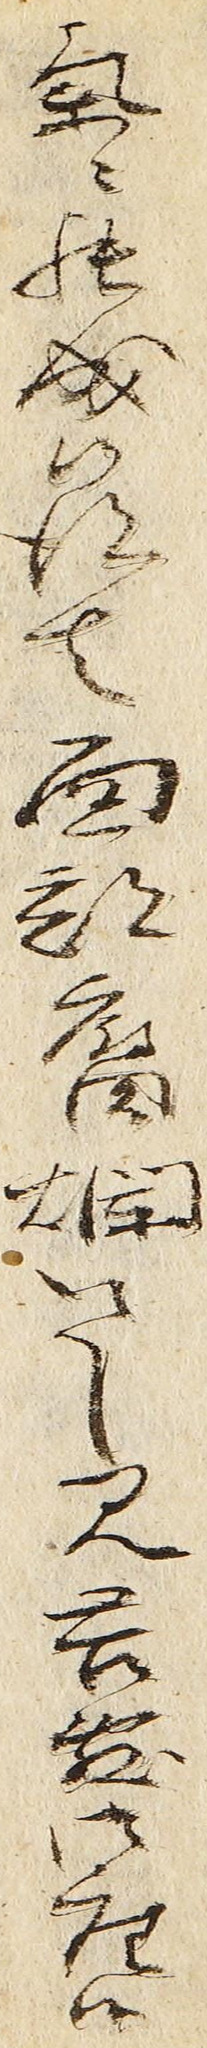気に罷成候得は面部腐爛いたし見苦敷御座候
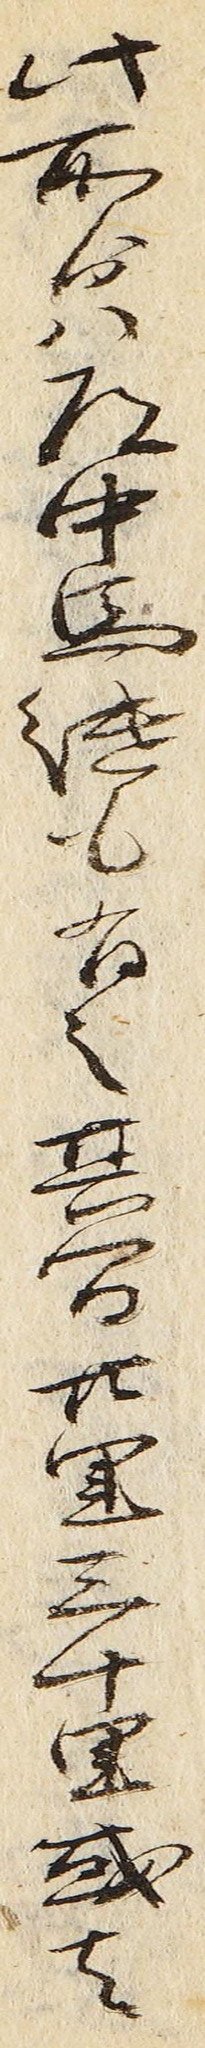此所ゟは道中馬継も有之其間廿里三十里或は
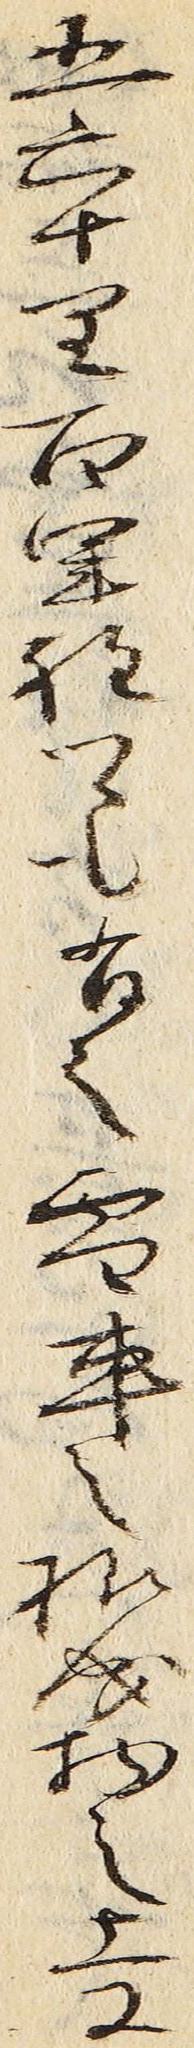五六十里百里程ツヽも有之雪車之様成物之上に
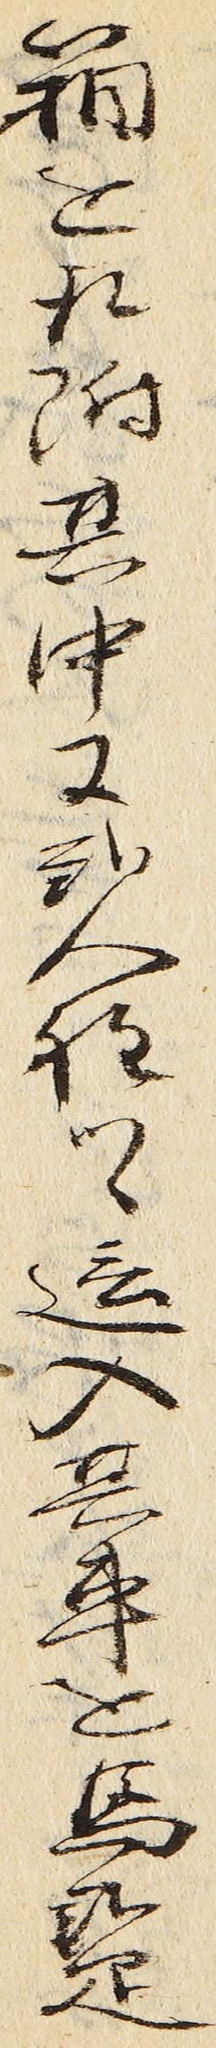箱を取附其中に弐人程ツヽ這入其車を馬弐疋
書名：漂民後記
